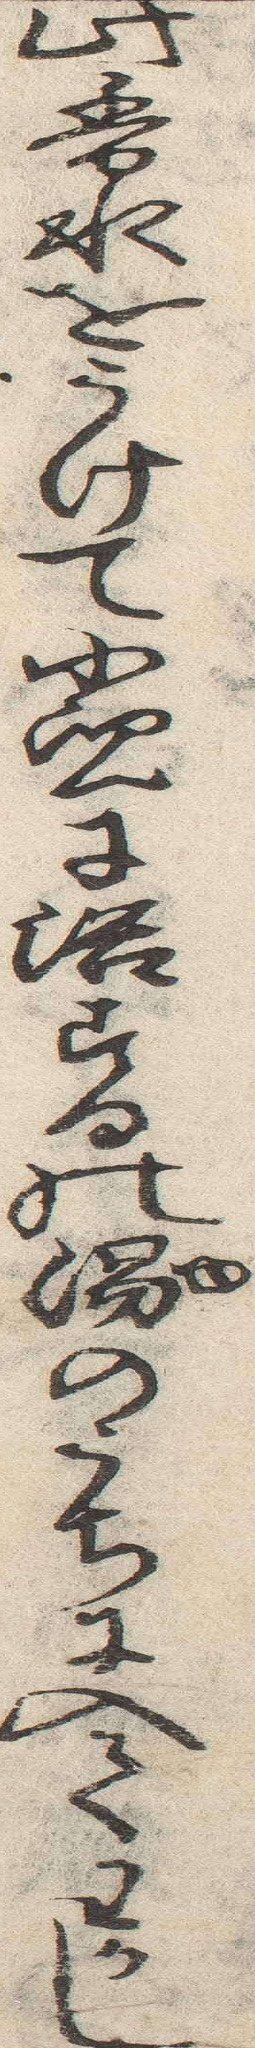此香水をうけて小児に浴するの湯のうちに入てわかし
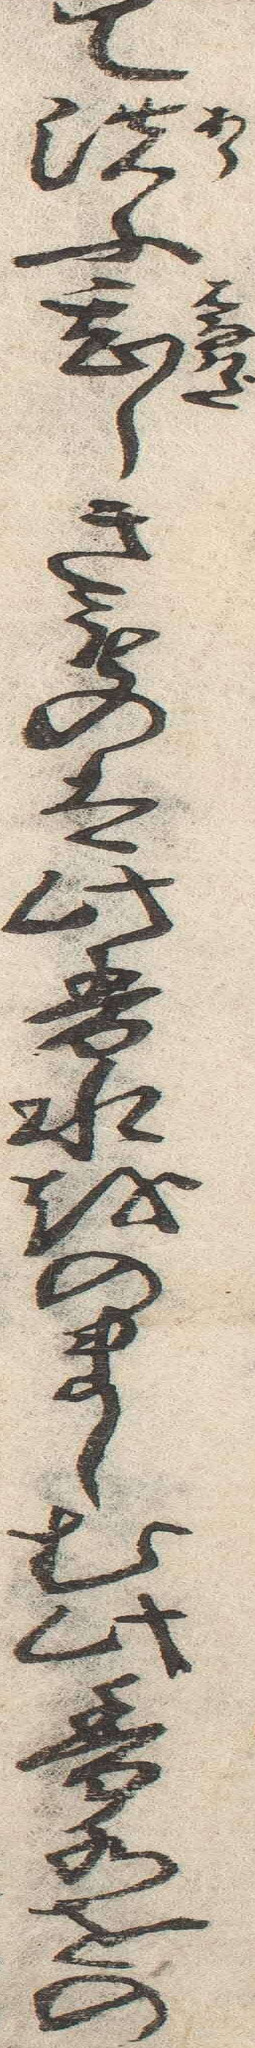て洗ふ甚しきものは此香水をのましむ此香水をの
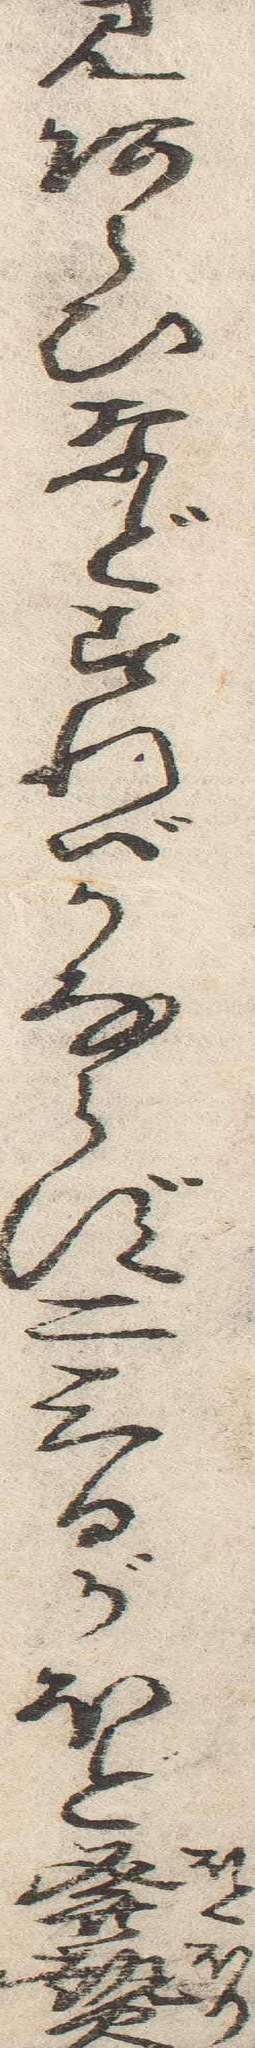みあらひなどすればかならず二三日がほと発熱
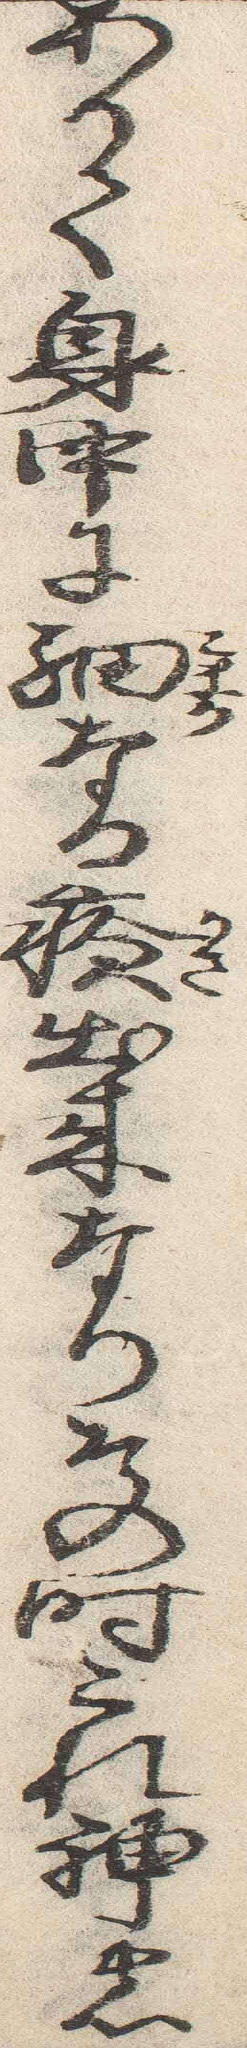ありて身中に細なる瘡出来なりその時これ神の
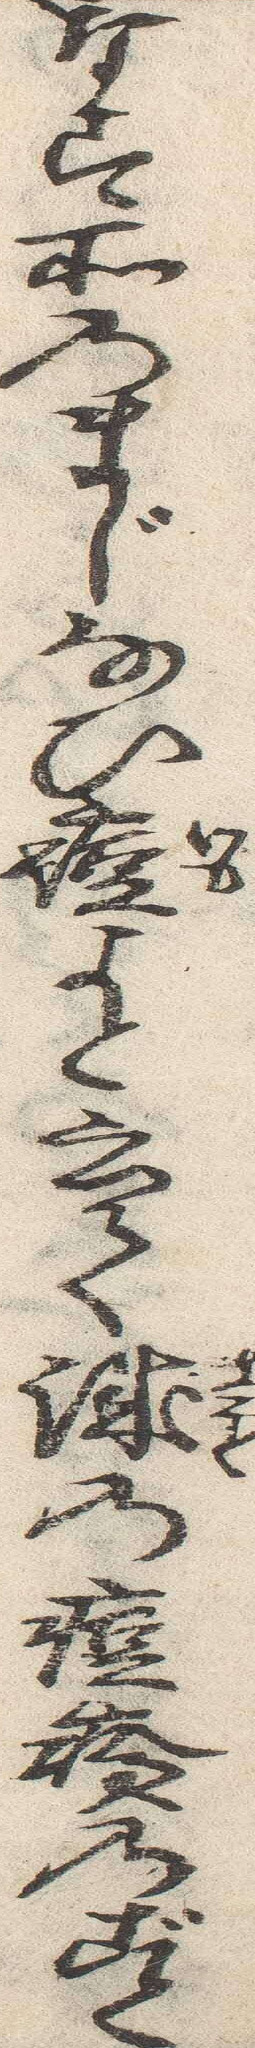なす所のまじなひ痘よと云て誠の痘瘡のごと
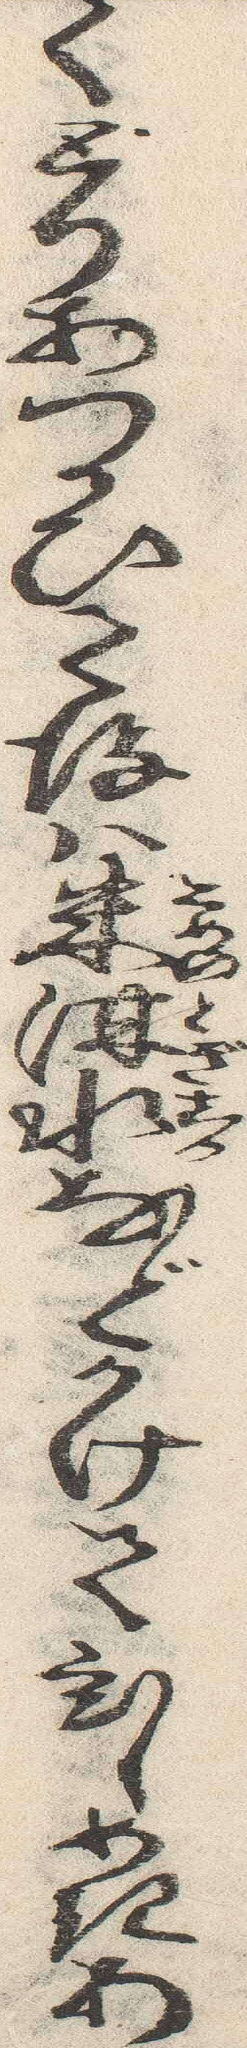くとりあつかひて後は米泔水などかけてひしめきあ
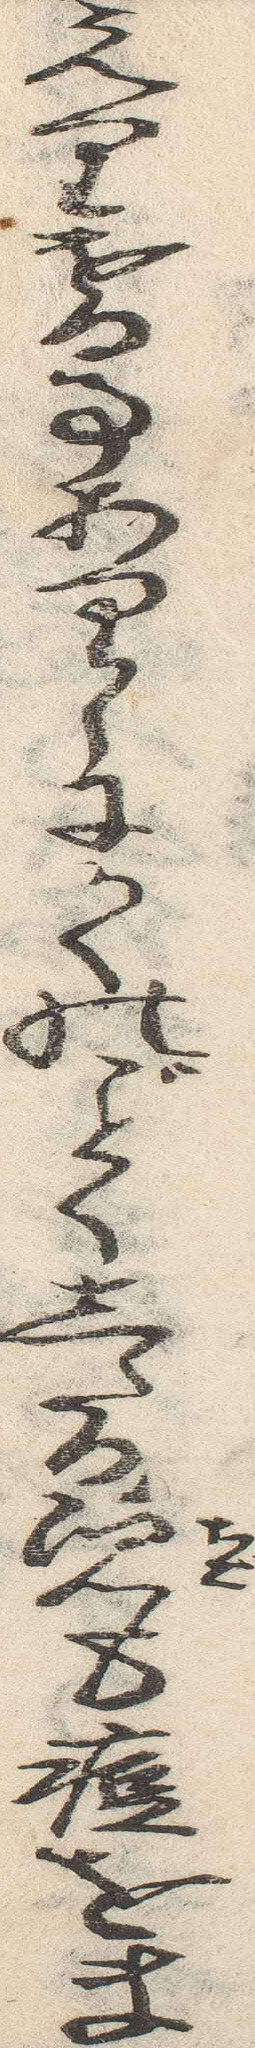えりける事ありしにかくのごとくしたる児も痘をま
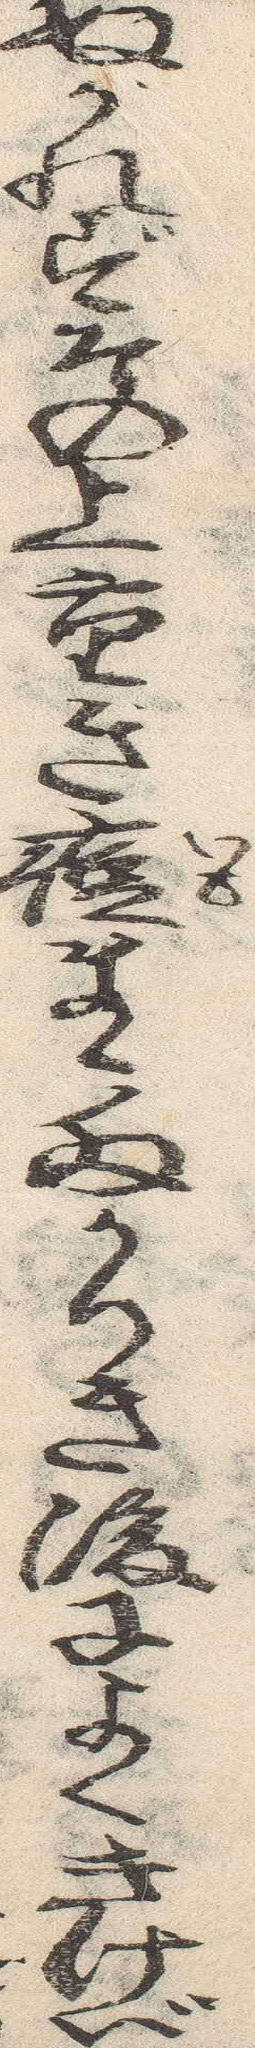ぬかれずその上重き痘まゝ多かりき後によくきけば
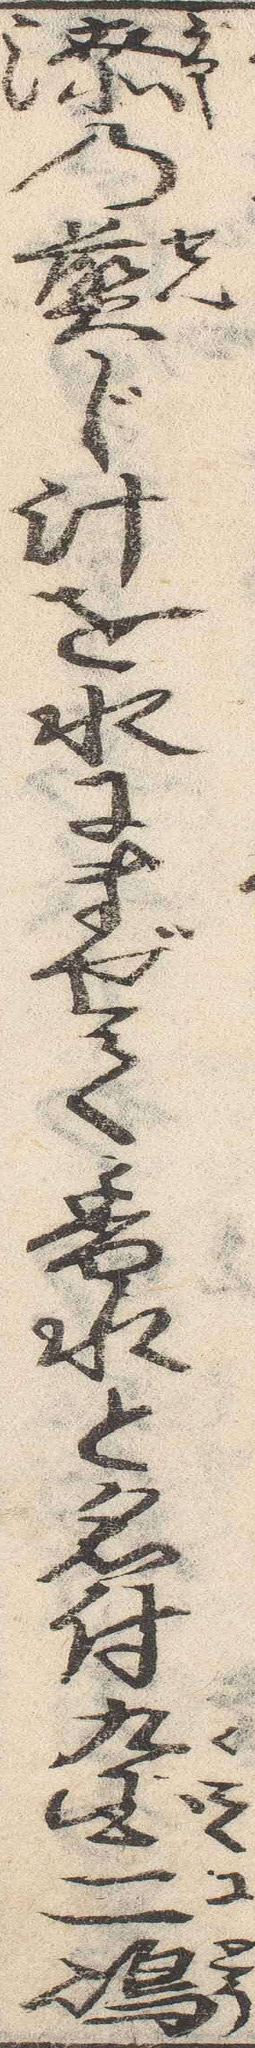漆の煎じ汁を水にまぜて香水と名付九国二島

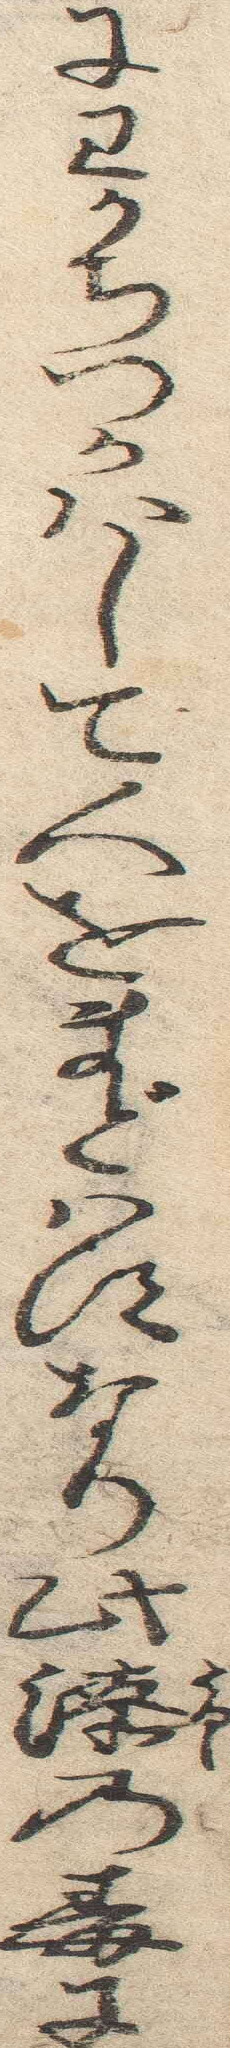にわかちつかはして人をまどはすなり此漆の毒に
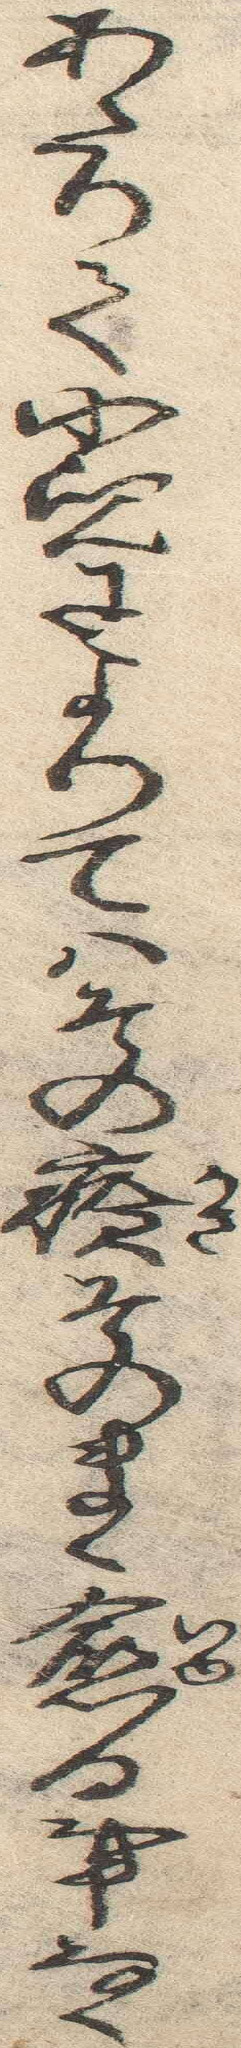あたりて小児によりてはその瘡そのまゝ愈る事なく
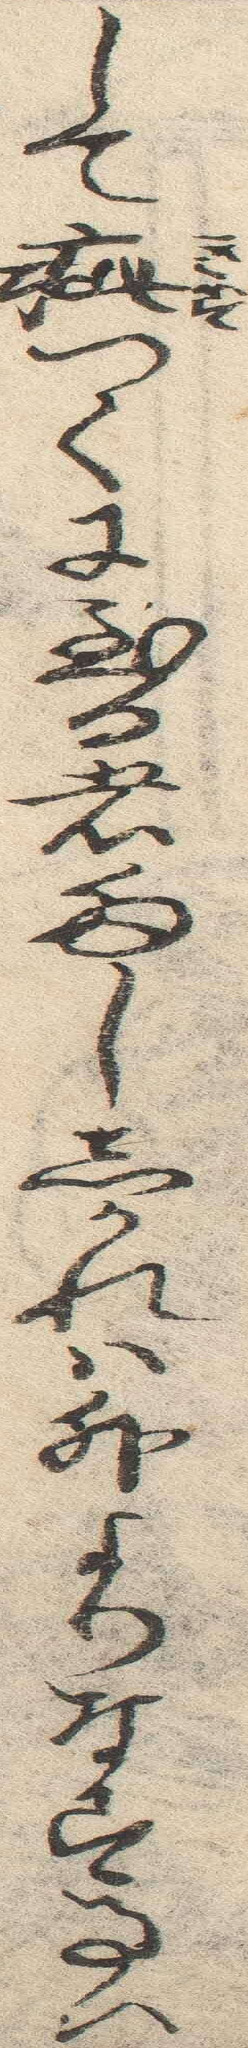して疵つくに至る者多ししかれは外よりなす事は
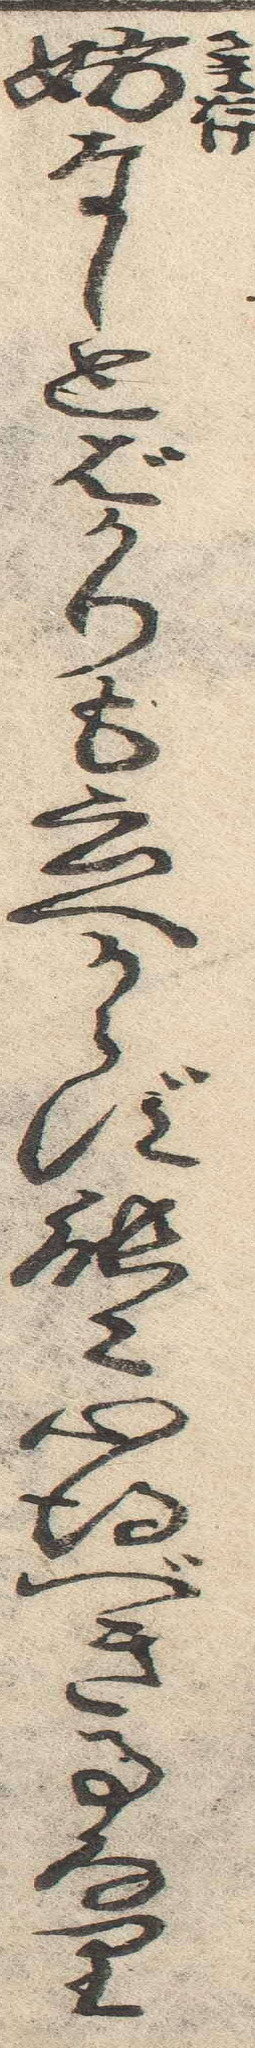妨なしとばかりも云へからず能々心得べき事なり
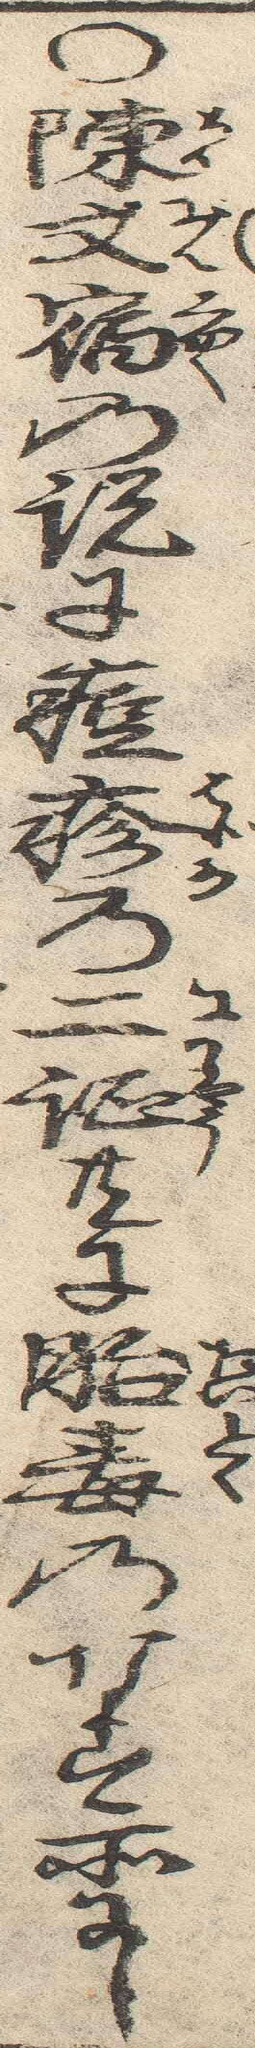○陳文宿の説に痘疹の二証共に胎毒のなす所にし
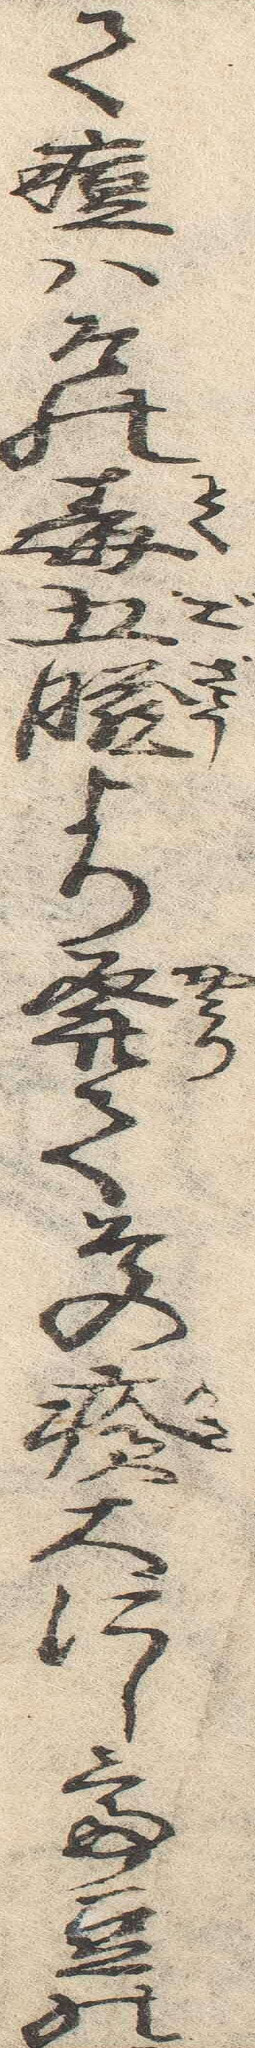て痘はその毒五臓より発てその瘡大にして豆の
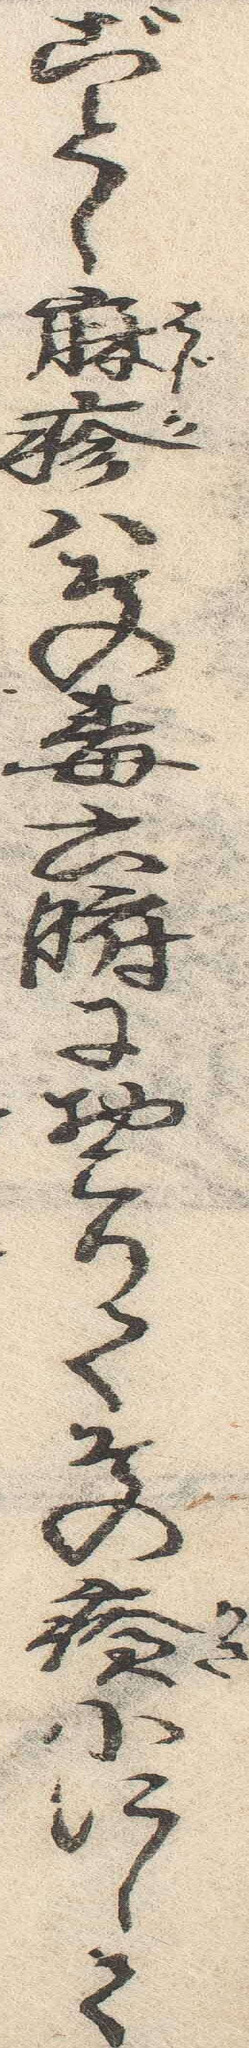ごとし麻疹はその毒六腑におこりてその瘡小にして
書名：小児必用養育草
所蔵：東京学芸大学附属図書館 国文学研究資料館
